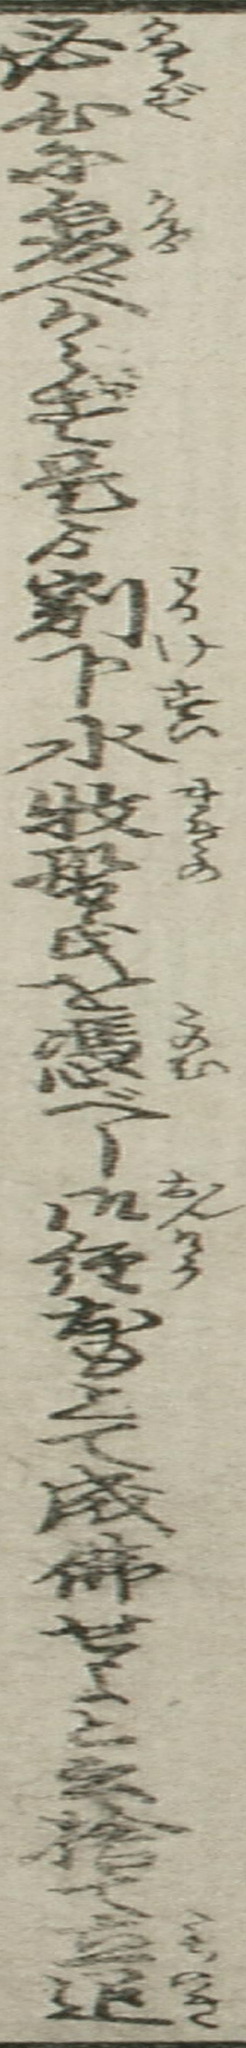必心に懸べからず是ゟ割下水牧野氏を憑べし御経おも上て成仏せよと云捨て立退
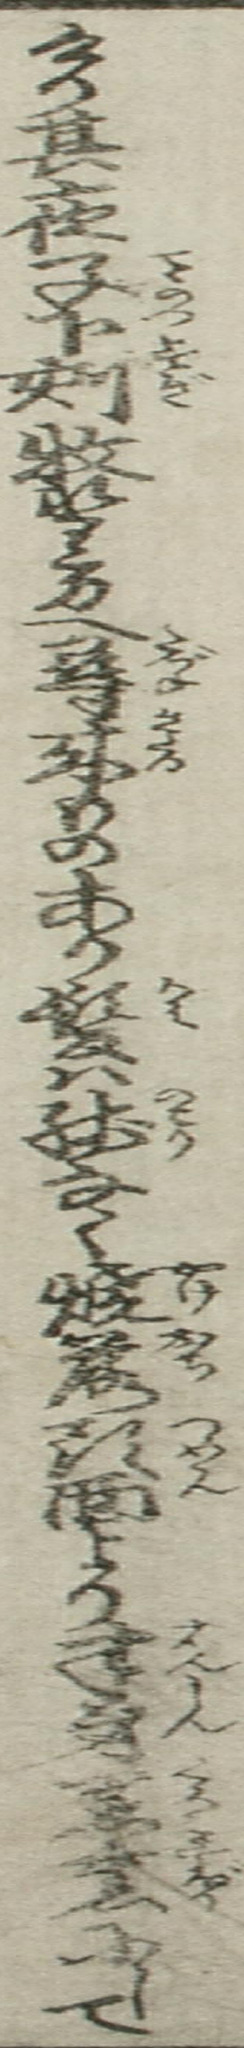けり其夜子下刻牧野方へ尋来ものあり髪は残なく焼落頭面より半身黒熏にして
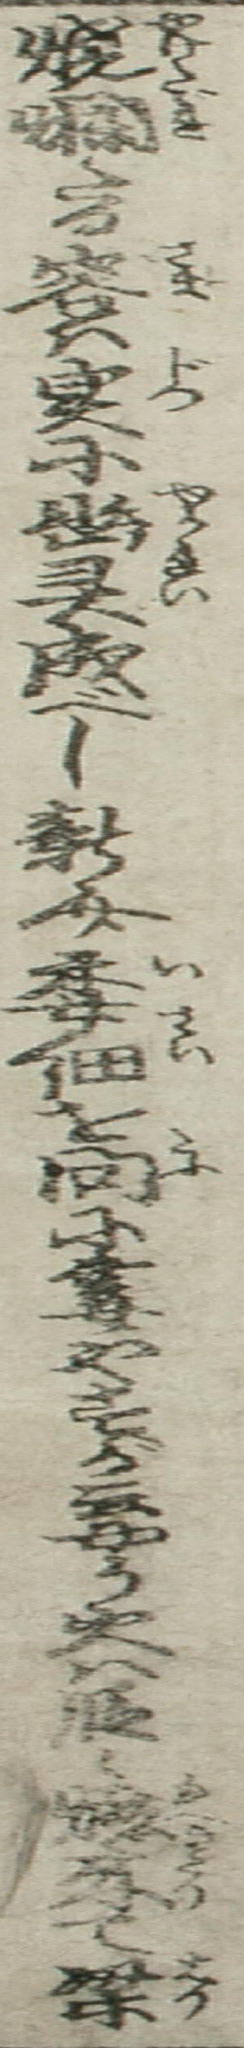焼爛たる容は実に幽霊成べし新介委細を問に妻やすが云やう火は段々燃来て梁
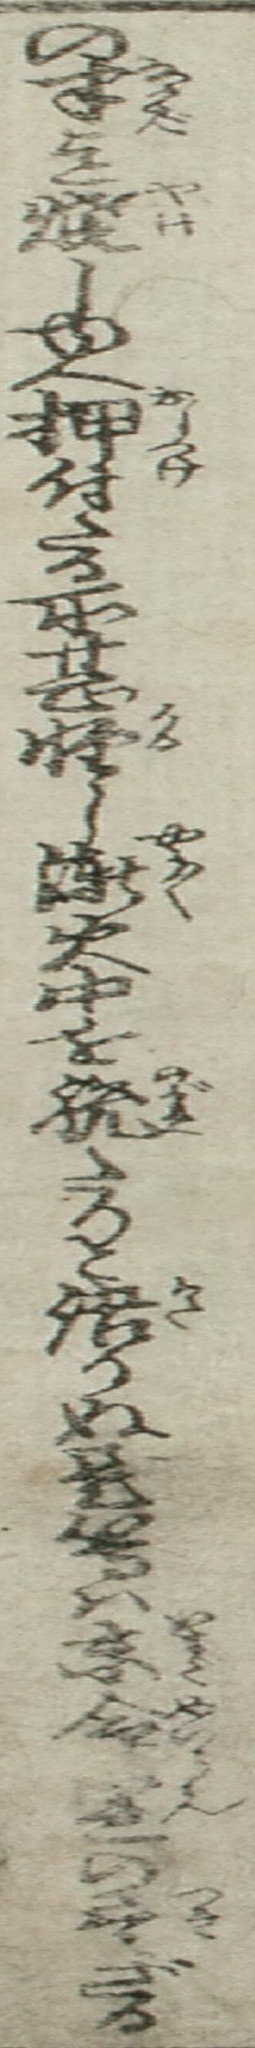の半を焼しゆへ押付たる所甚軽し漸火中を脱たるを語りぬ是等は未命運の尽ざる
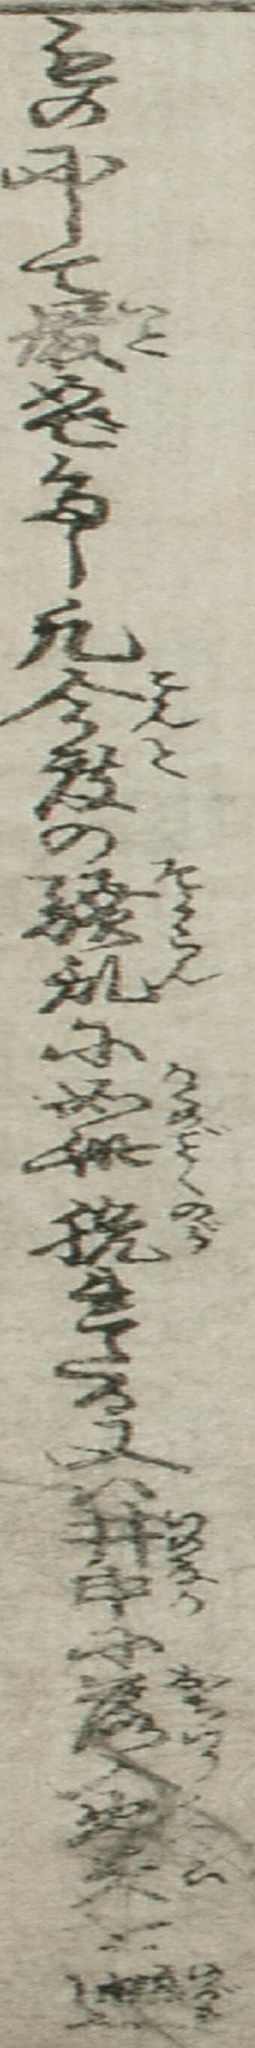ものにして最めでたし凡今度の騒乱に如此脱れたる又は井中に落入火災を逃
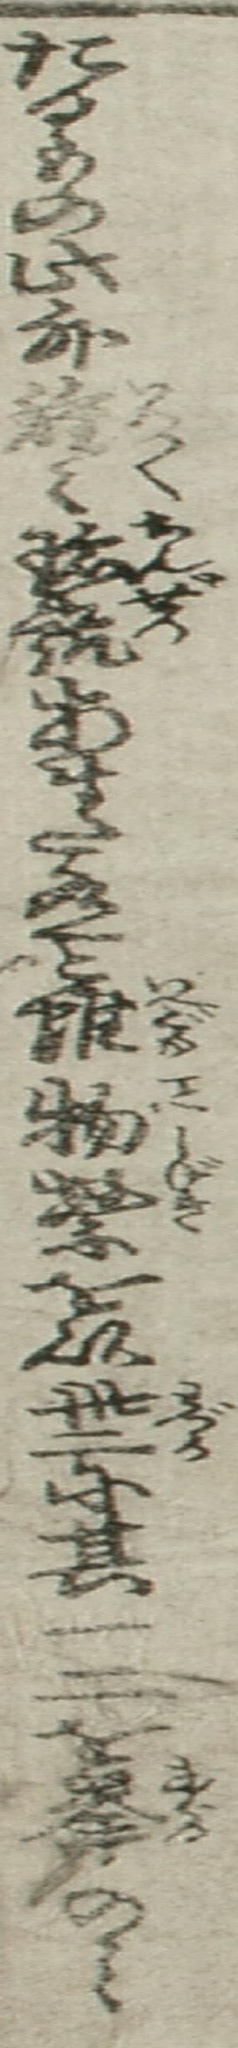たるもの此外種〻珍説あまた有と雖物繁を以些に其一二を挙のみ

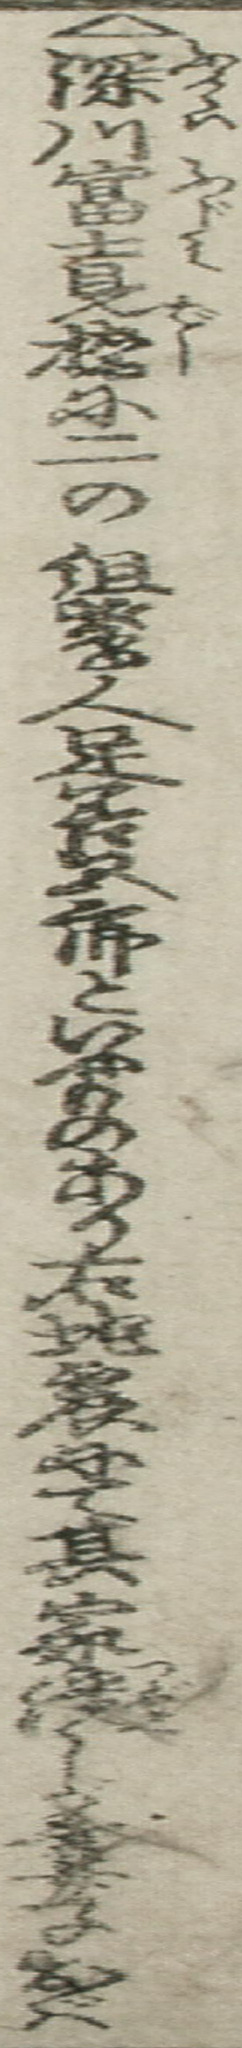△深川富士見橋に二の組鳶人足善五郎といふものあり右地震にて其家潰しが妻子おば
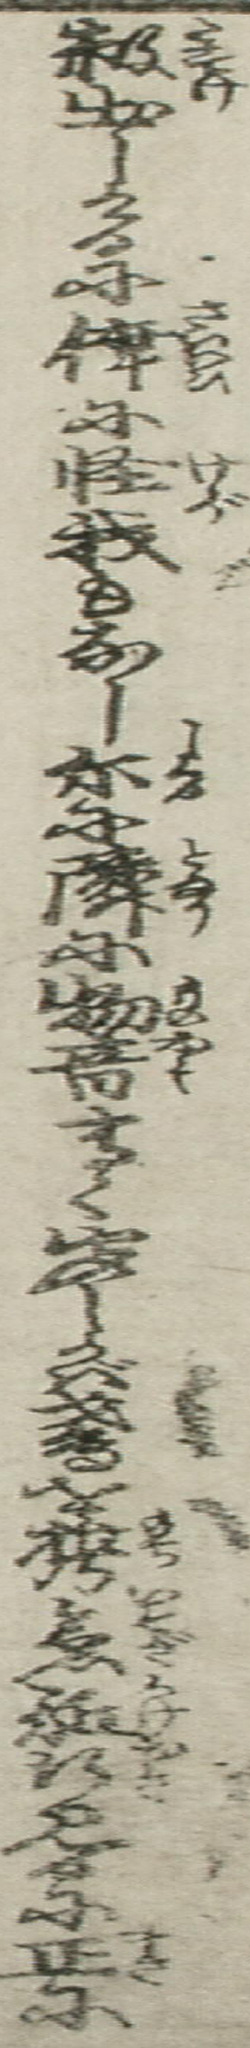赦出しけるに倖に怪我もなし尓に隣に物音高く聞しかば鳶を携急駈行見るに正に
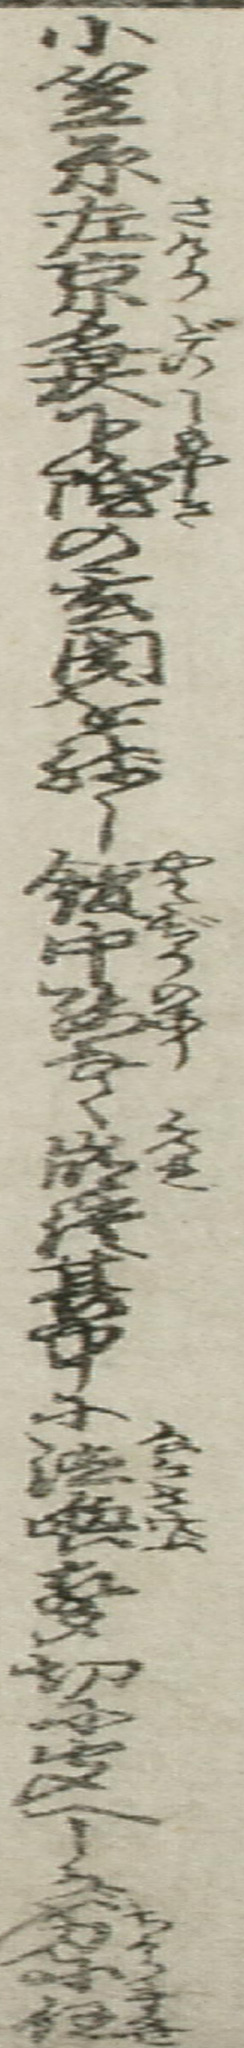小笠原左京矦下邸の玄関を残し館中残なく崩潰其中に泣喚聲切に聞へしかば力に任
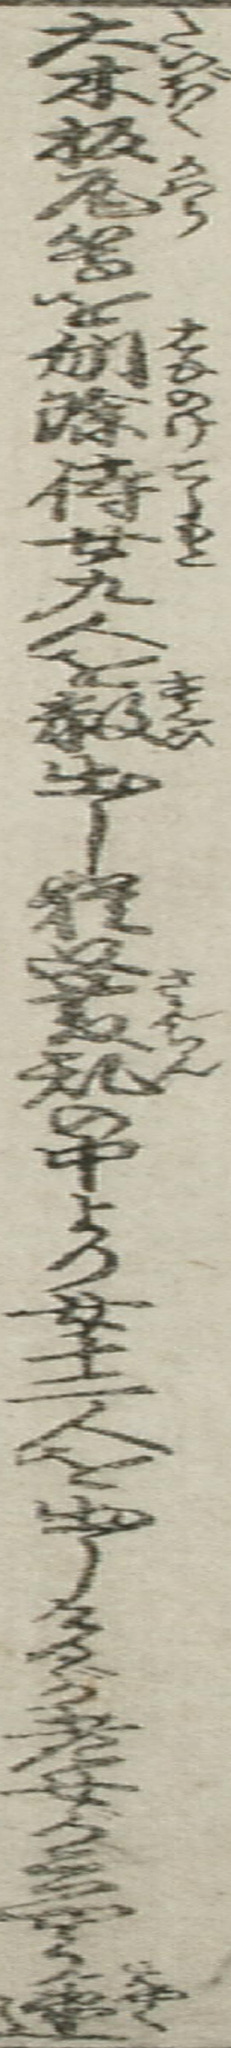大木板瓦等を刎除侍女九人を赦出し猶又散乱の中より女十二人を出しけるが老女が云やう速
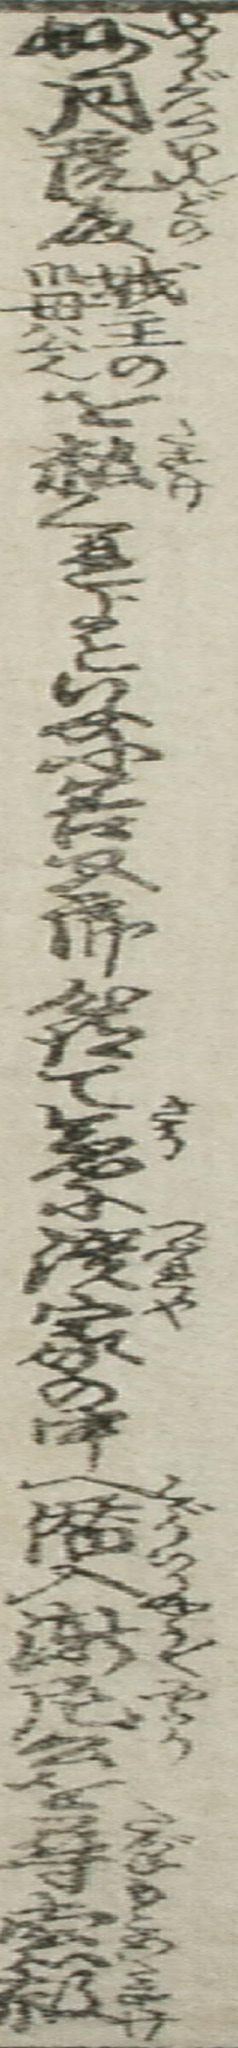妙月院殿城主の御母公也を赦くれよといふに善五郎心得て急に潰家の中へ潜入漸尼公を尋索赦
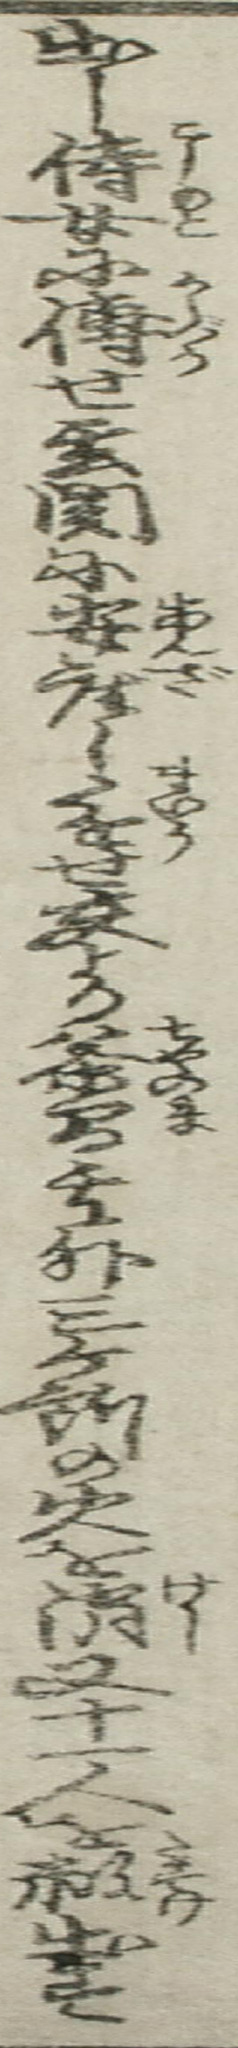出し侍女に傅せ玄関に安座し進せ夫より茶間其外三ヶ所の火を消又十一人を赦出す
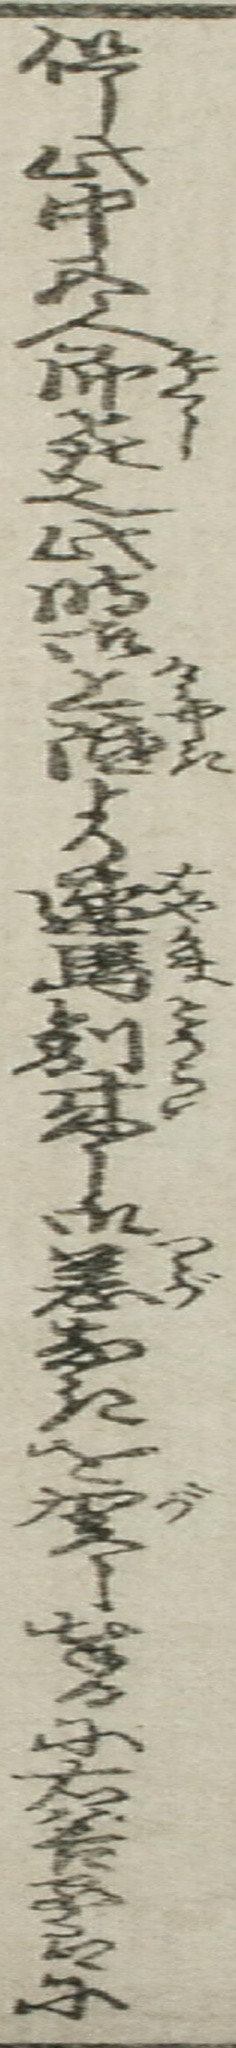但し此中五人即死也此時御上邸より速馬到来し御恙なきを賀し奉るに右善五郎に
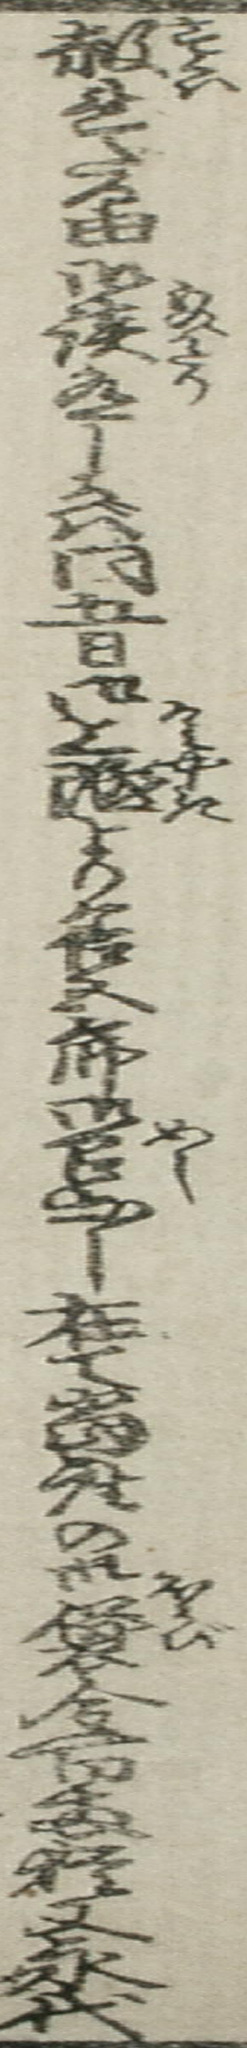赦れたる由御談有しかば同五日御上邸より善五郎御召出し在て当座の御褒金百両猶又永代
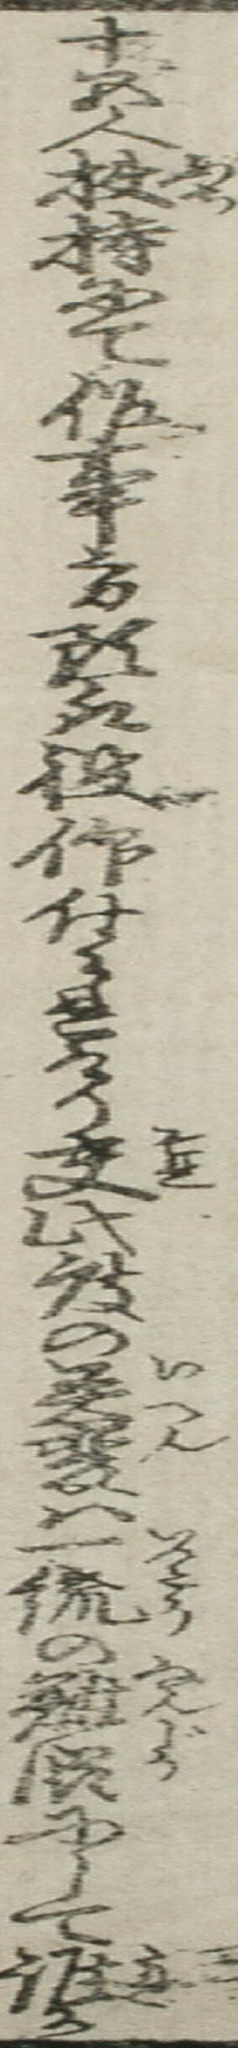十五人扶持にて作事方頭取役仰付られけり夫此度の異変は一統の難渋にして誰か
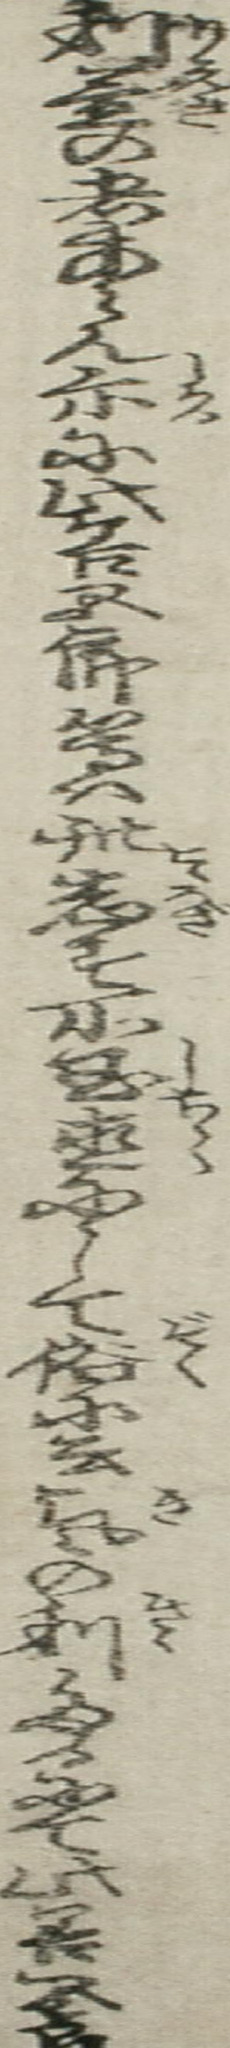利益の者あらん尓に此善五郎等は此志す所至直にして俗に云気の利たるにて此善五郎
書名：安政見聞誌　上
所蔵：東京大学地震研究所図書室 Earthquake Research Institute Library, The University of Tokyo, JAPAN
